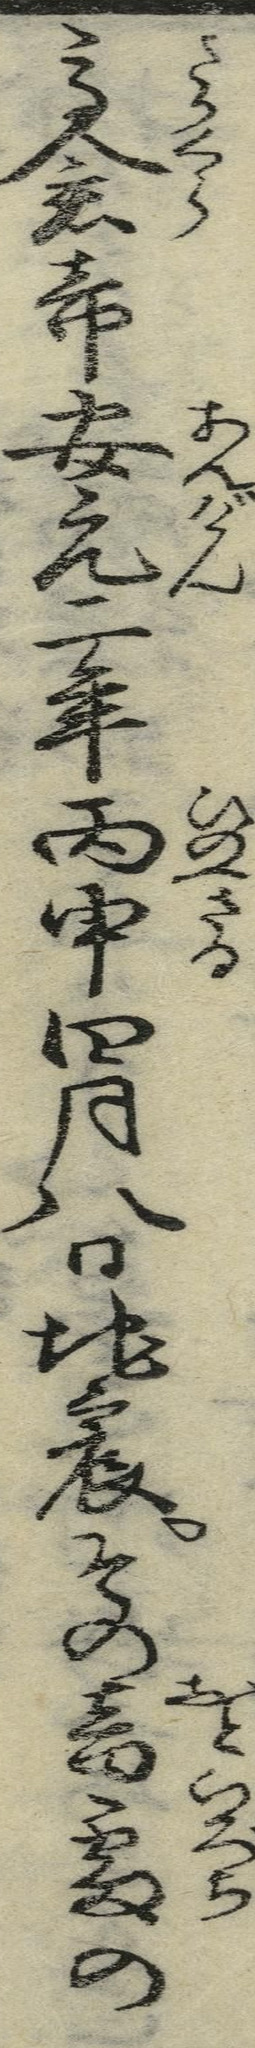高倉帝安元二年丙申四月八日地震。その音雷の
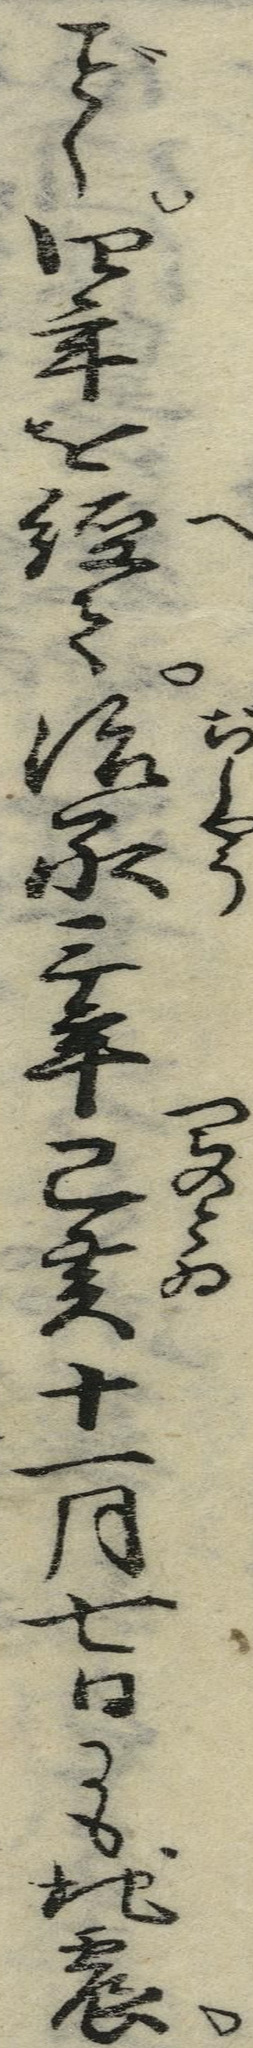ごとし。四年を経て。治承三年己亥十一月七日にも地震。
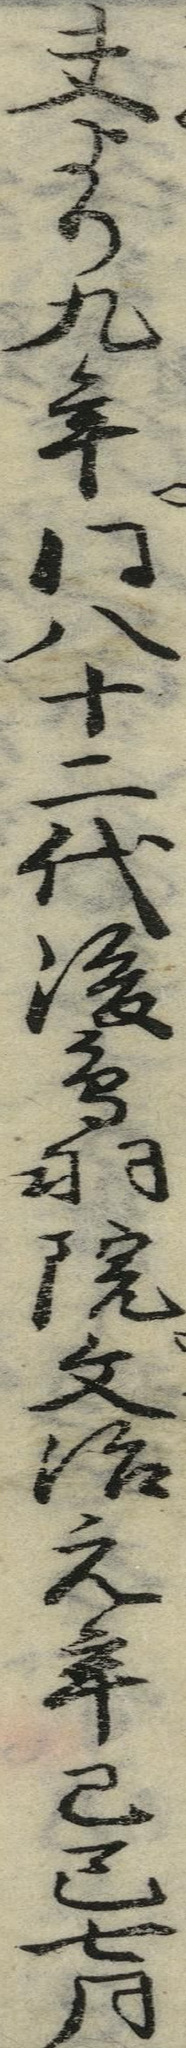夫より九年。同八十二代後鳥羽院。文治元年己巳七月
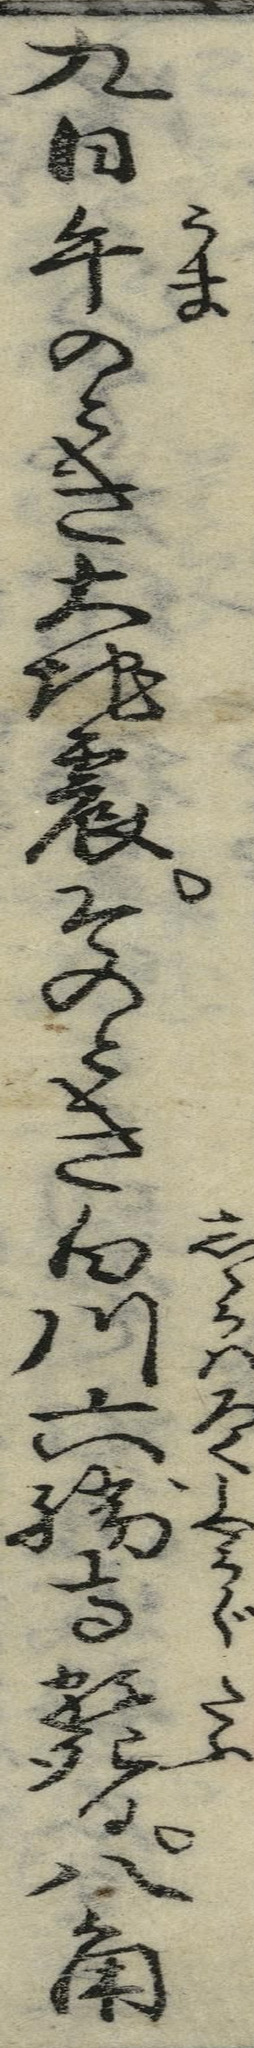九日午のとき大地震。そのとき白川六勝寺斃る。八角
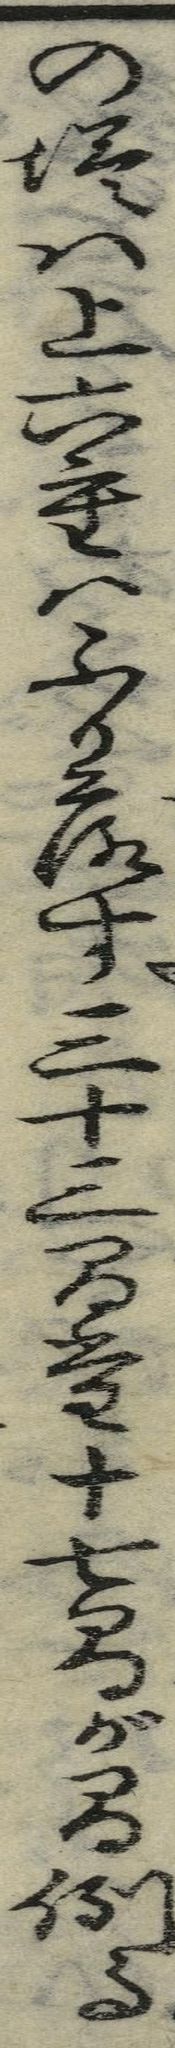の塔は上六重はふり落す。三十三間堂十七間が間倒る。
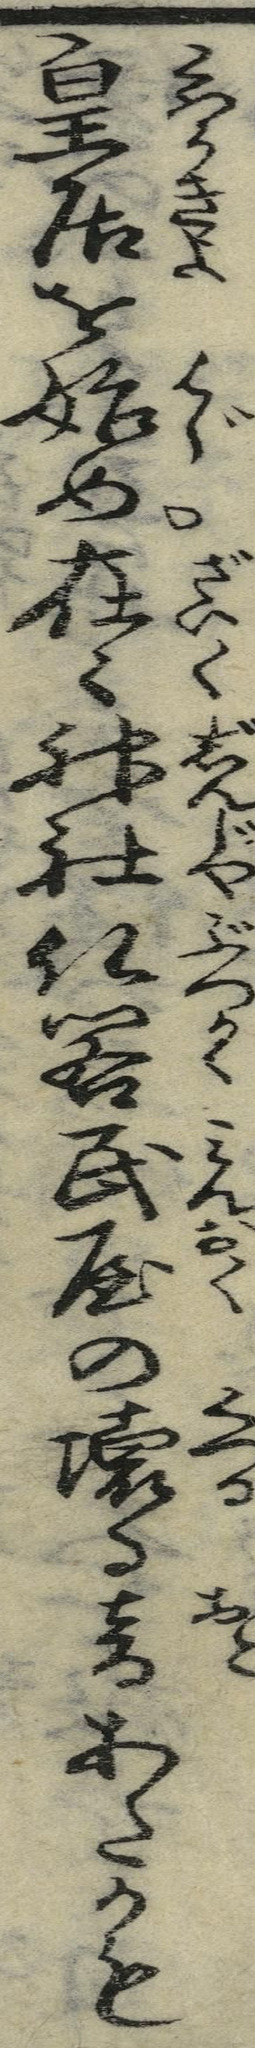皇居を始め。在々神社仏閣民屋の壊る音あたかも

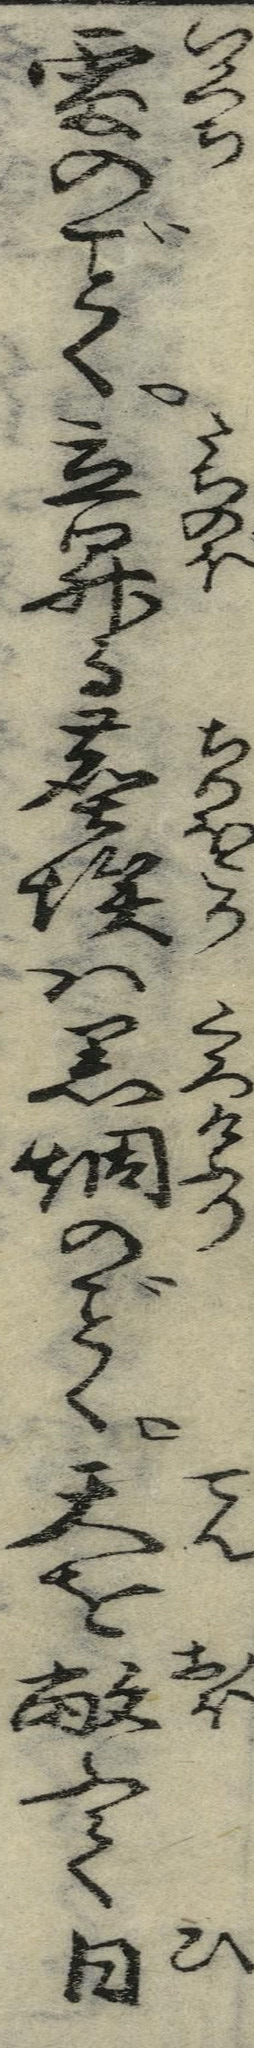雷のごとく。立昇る塵埃は黒烟のごとく。天を敝ふて日
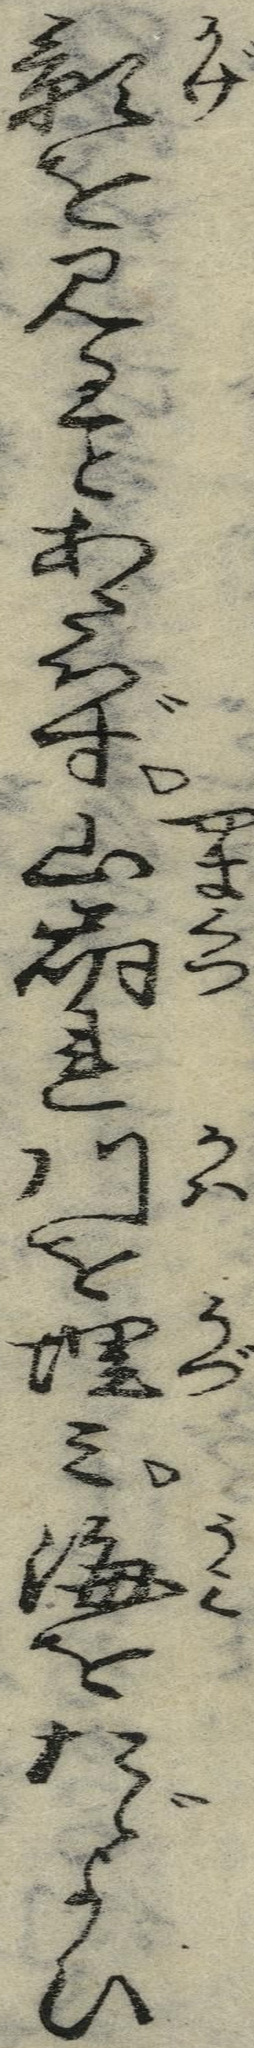影を見ることあたはず。山崩れ川を埋み。海をたゞよひ
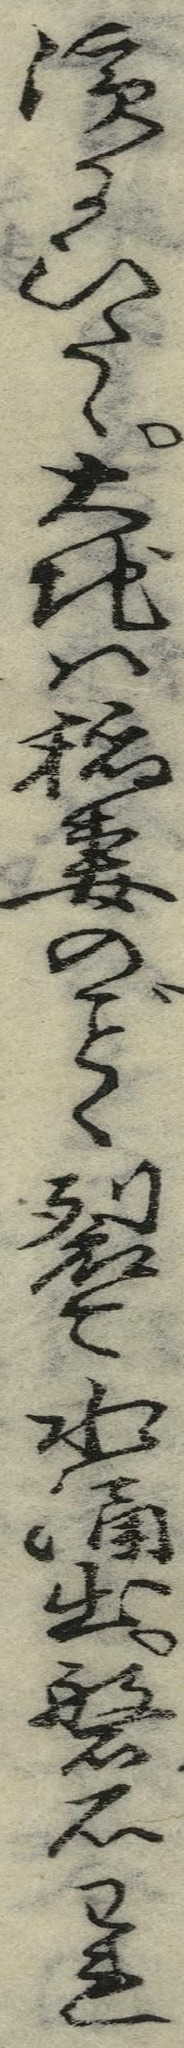浜かひて。大地は稲妻のごとく裂て水涌出。磐石われ
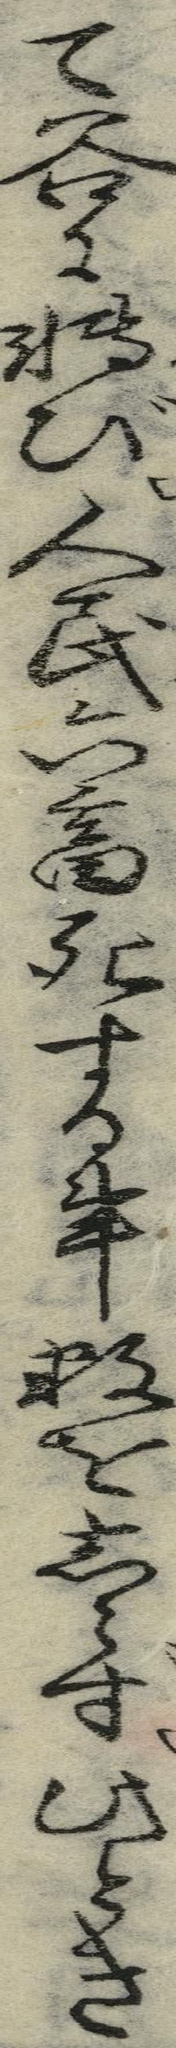て谷に転び。人民六畜死する事数をしらず。此とき
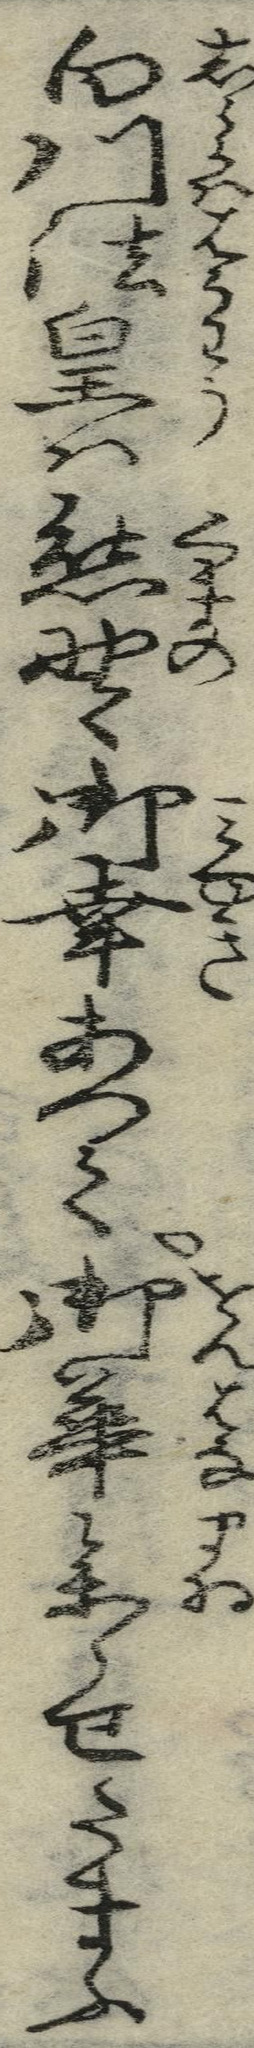白川法皇は熊野御幸あつて。御華参らせたまふ
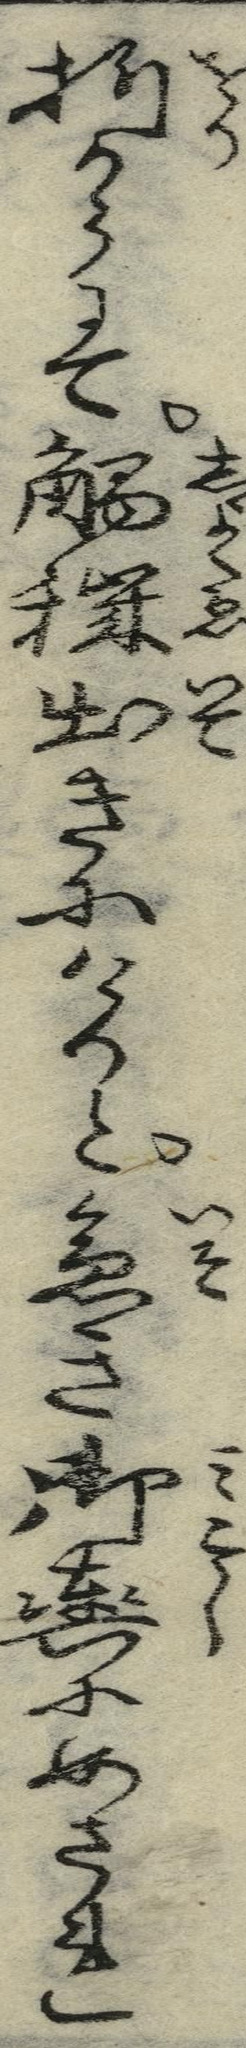折からにて。触穢出きにけりと。急き御輿にめされ
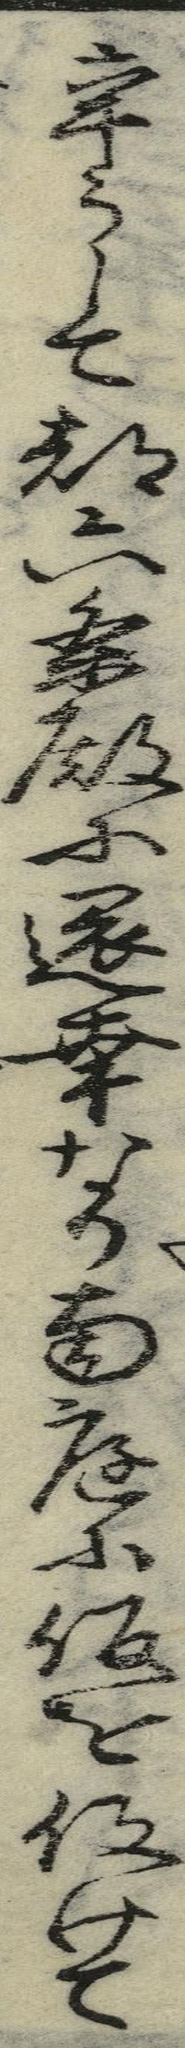辛うして都六条殿に還幸なり。南庭に仮を設けて
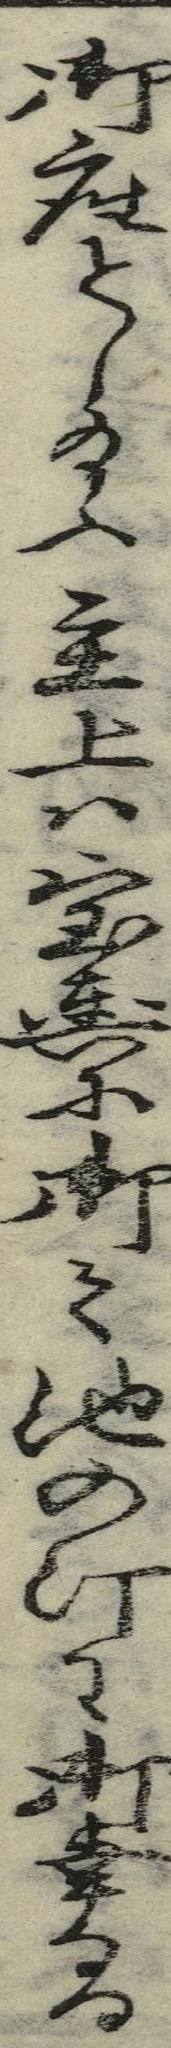御座とし給ふ主上は宝輿に御て池の汀に御幸なる
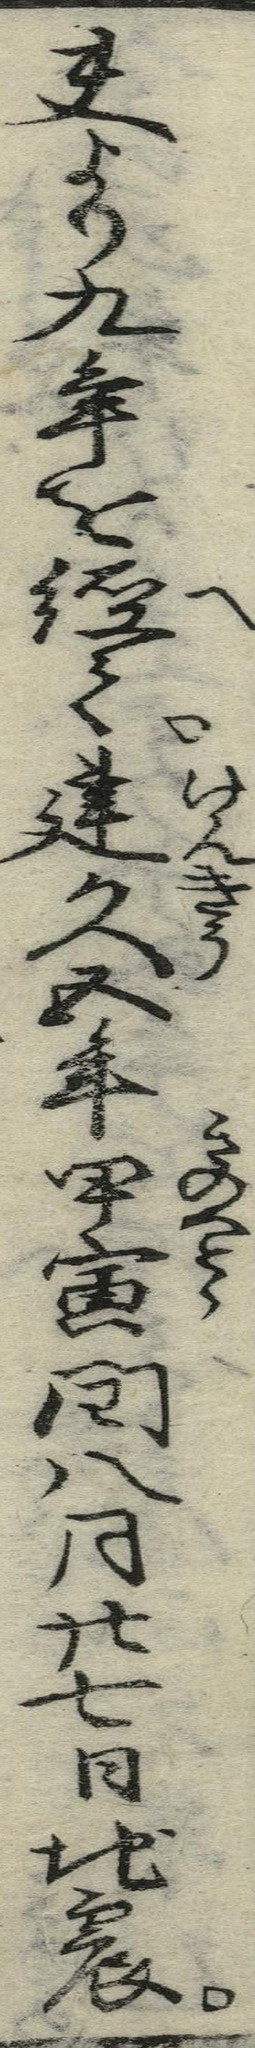夫より九年を経て。建久五年甲寅閏八月廿七日地震。
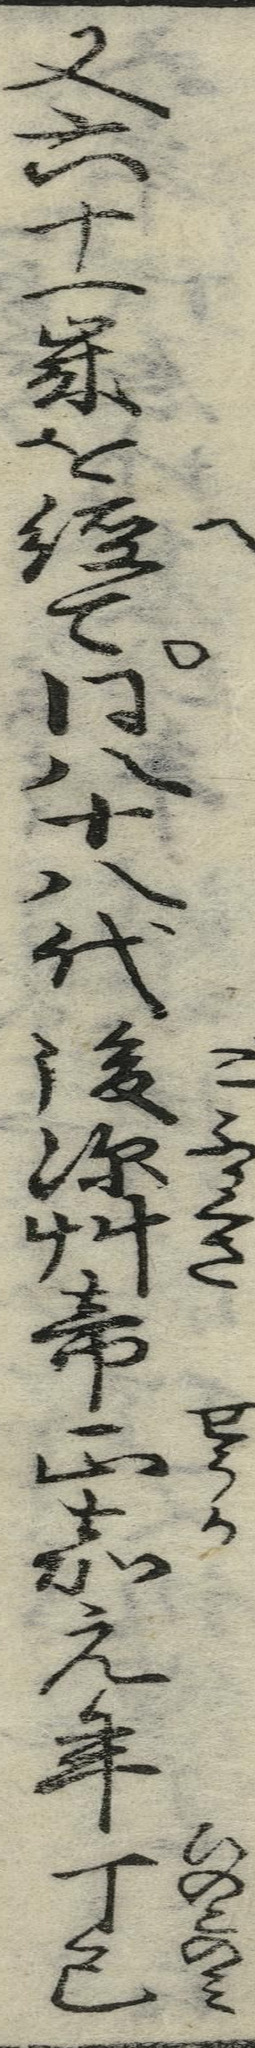また六十一歳を経て。同八十八代後深草帝正嘉元年丁巳
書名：本朝地震記　全
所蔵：東京大学地震研究所図書室 Earthquake Research Institute Library, The University of Tokyo, JAPAN
